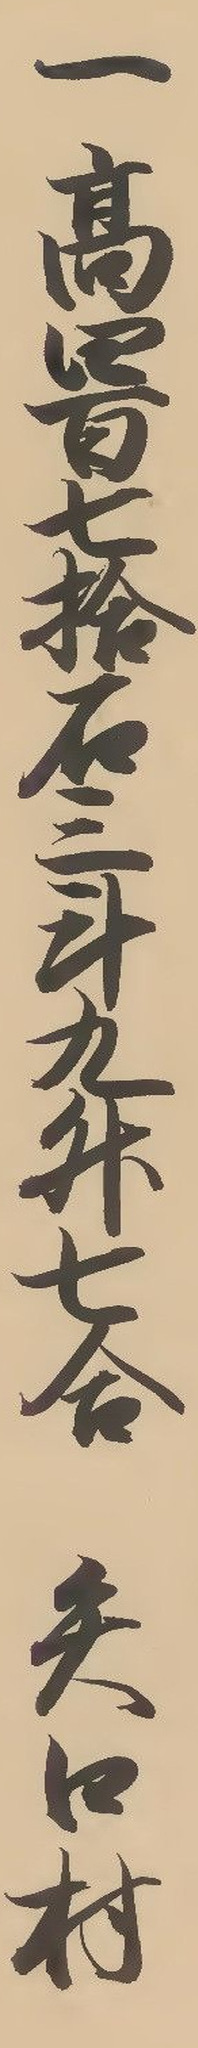一高四百七拾石三斗九升七合矢口村

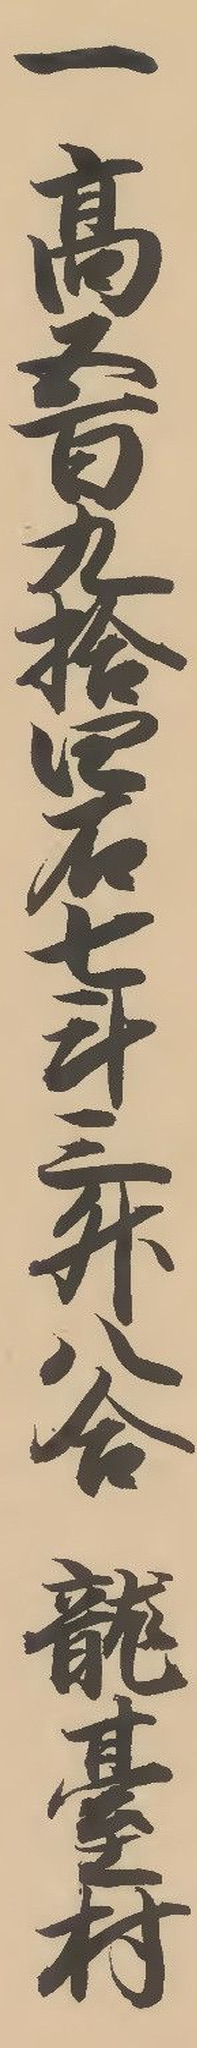一高五百九拾四石七斗三升八合龍台村
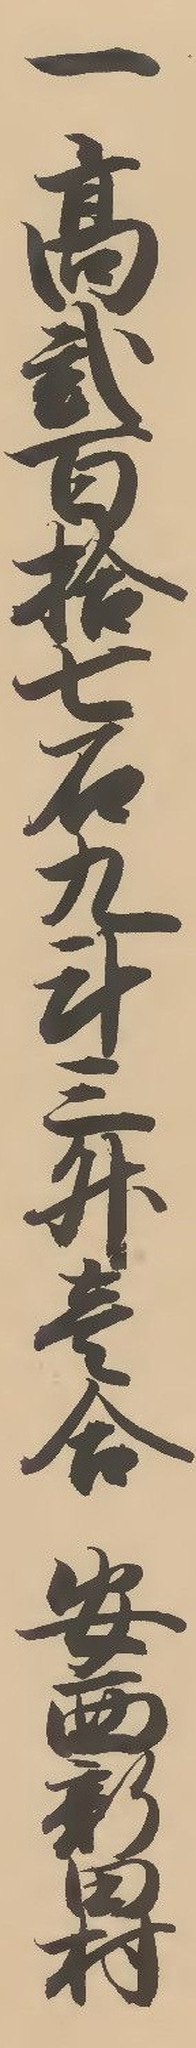一高弐百拾七石九斗三升壱合安西新田村
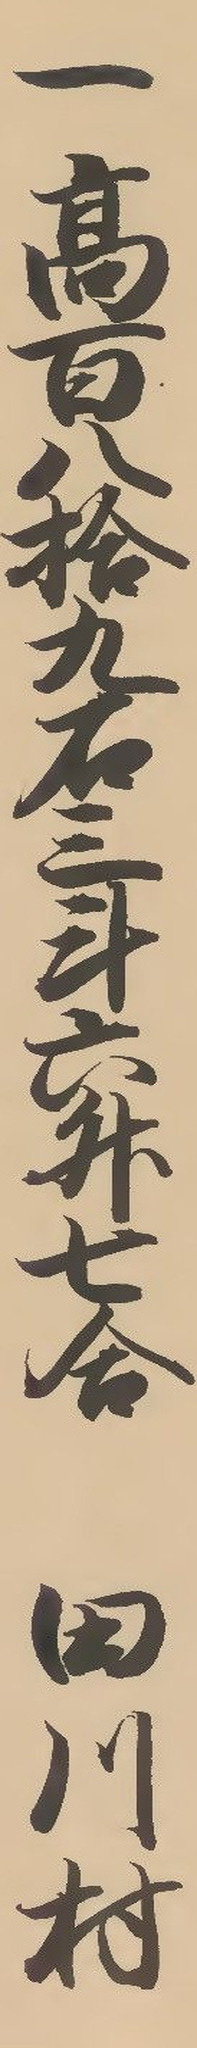一高百八拾九石三斗六升七合田川村
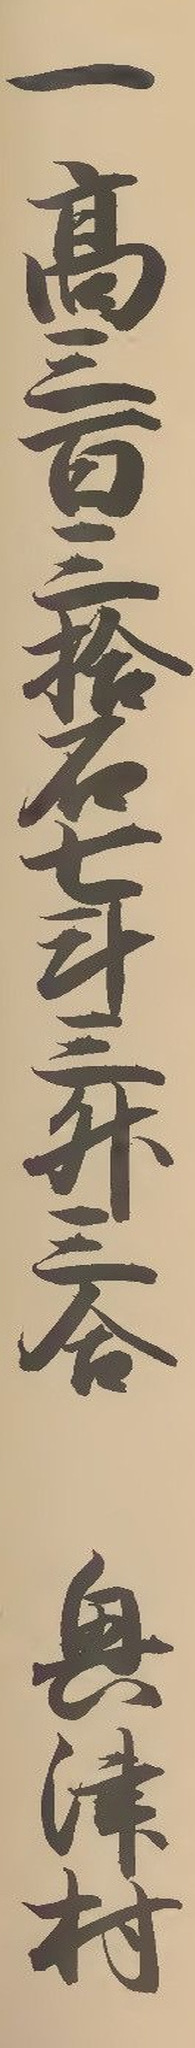一高三百三拾石七斗三升三合興津村
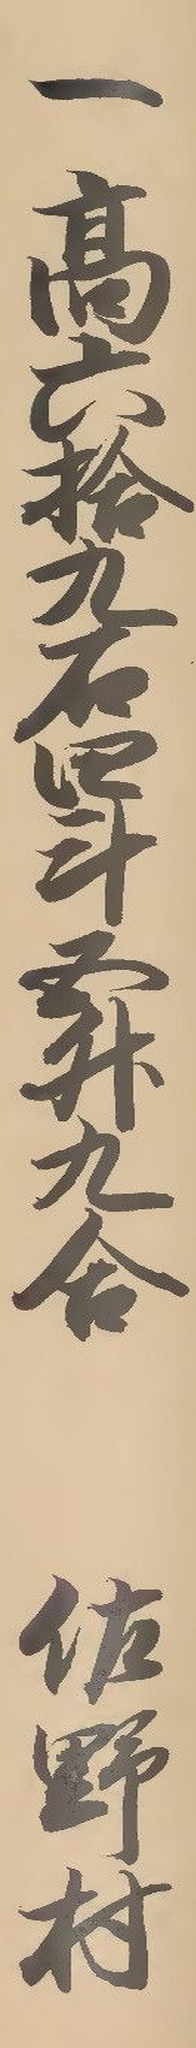一高六拾九石四斗五升九合佐野村
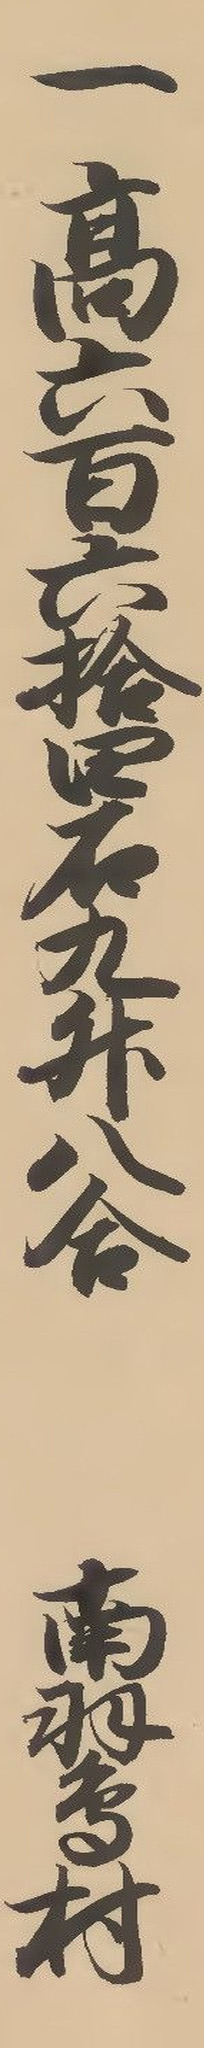一高六百六拾四石九升八合南羽鳥村
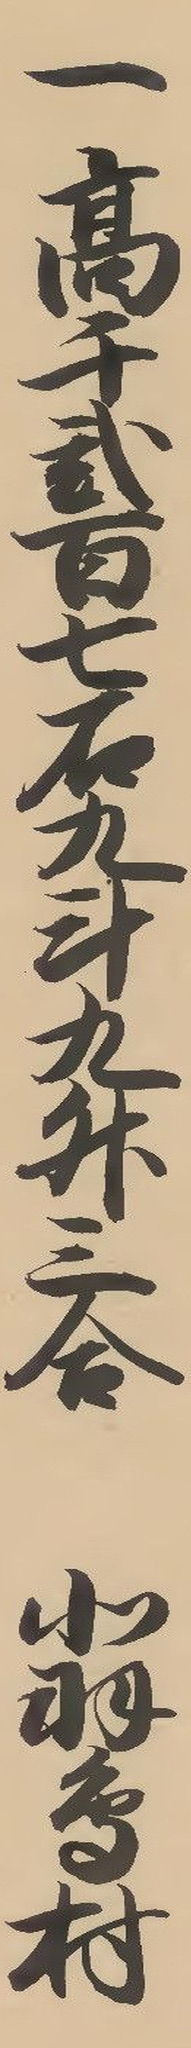一高千弐百七石九斗九升三合北羽鳥村

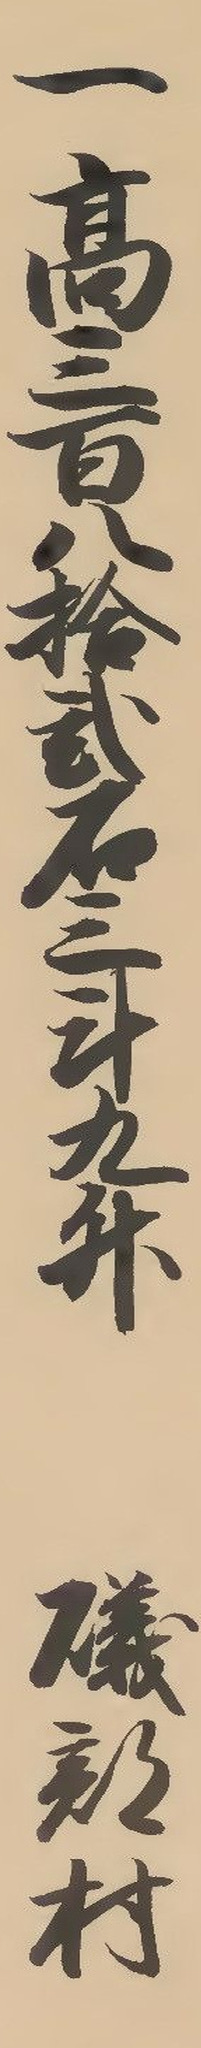一高三百八拾弐石三斗九升磯部村
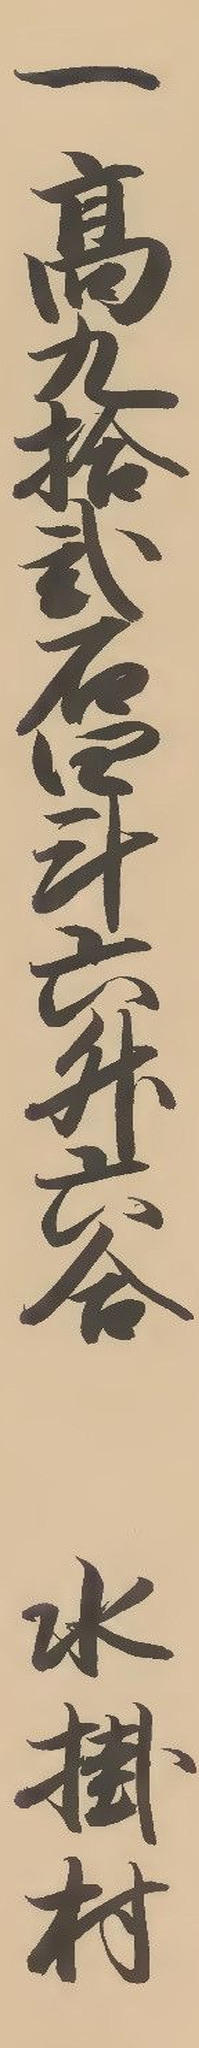一高九拾弐石四斗六升六合水掛村
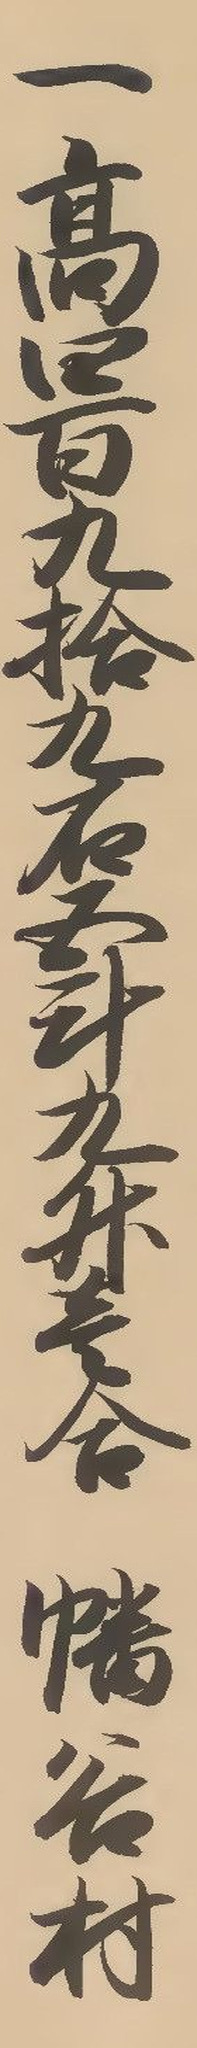一高四百九拾九石五斗九升壱合幡谷村
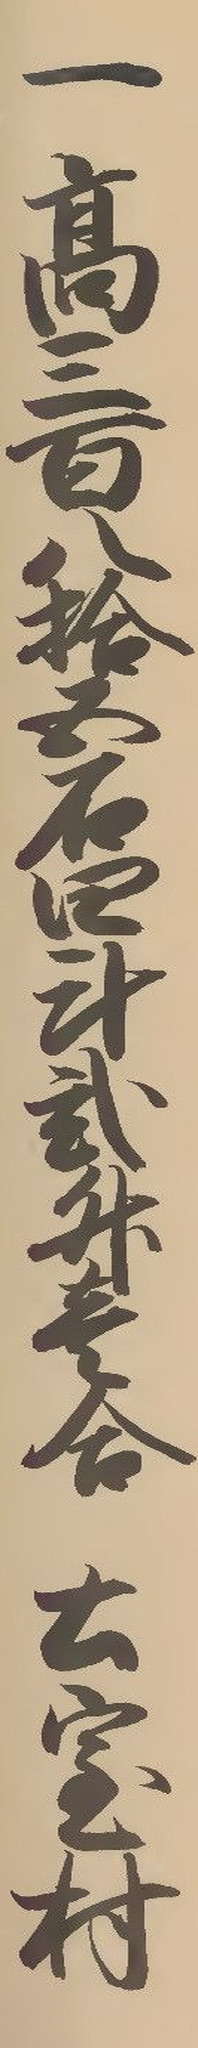一高三百八拾五石四斗弐升壱合土室村
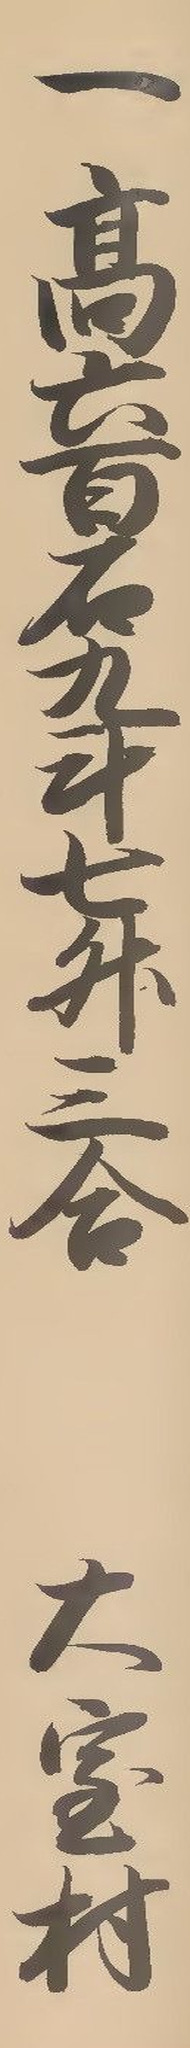一高六百石九斗七升三合大室村
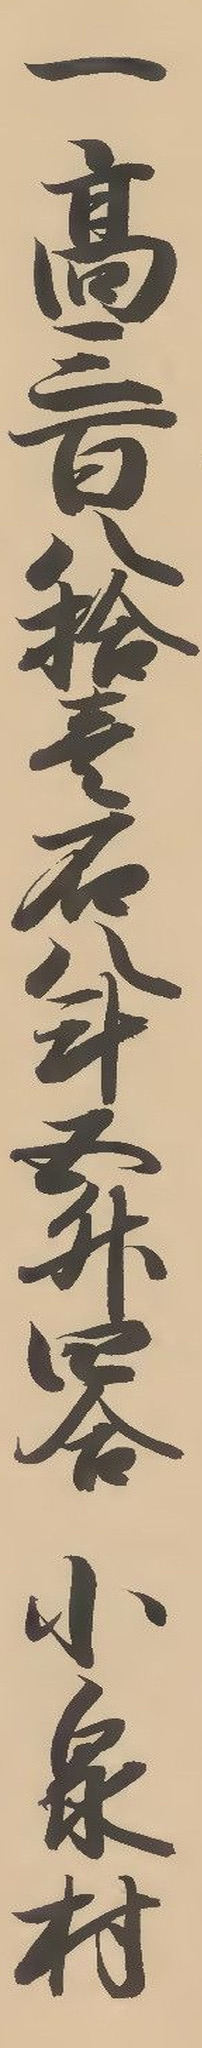一高三百八拾壱石八斗五升四合小泉村
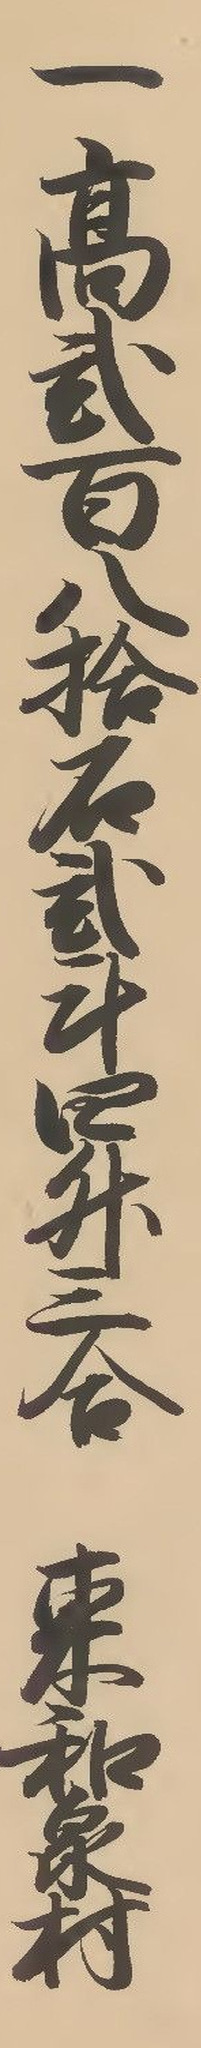一高弐百八拾石弐斗四升三合東和泉村
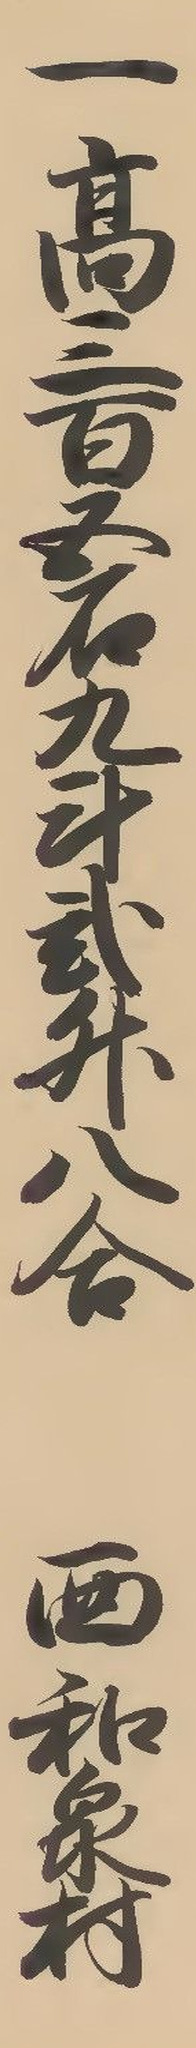一高三百五石九斗弐升八合西和泉村
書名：下総国郷帳
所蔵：国立公文書館 National Archives of Japan
